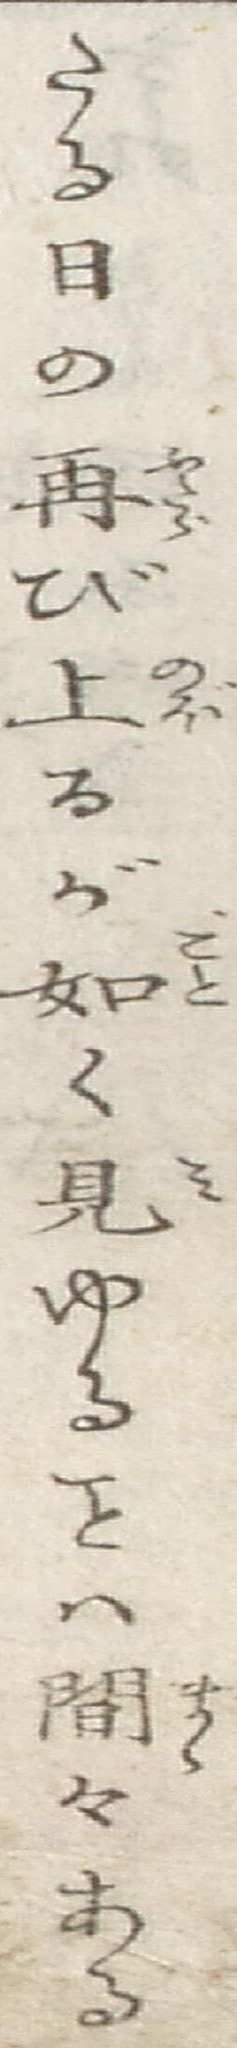たる日の再び上るが如く見ゆることは間々ある
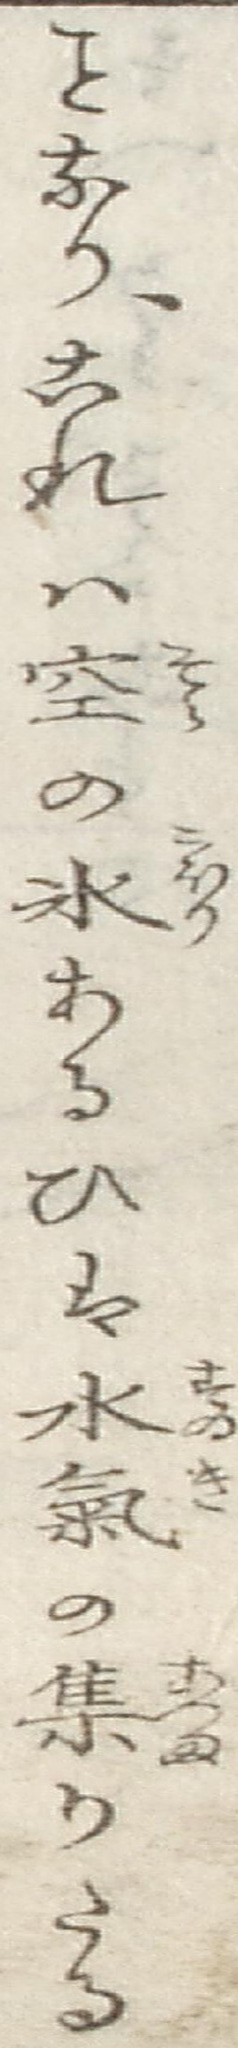ことなり、これは空の氷あるひは水気の集りたる
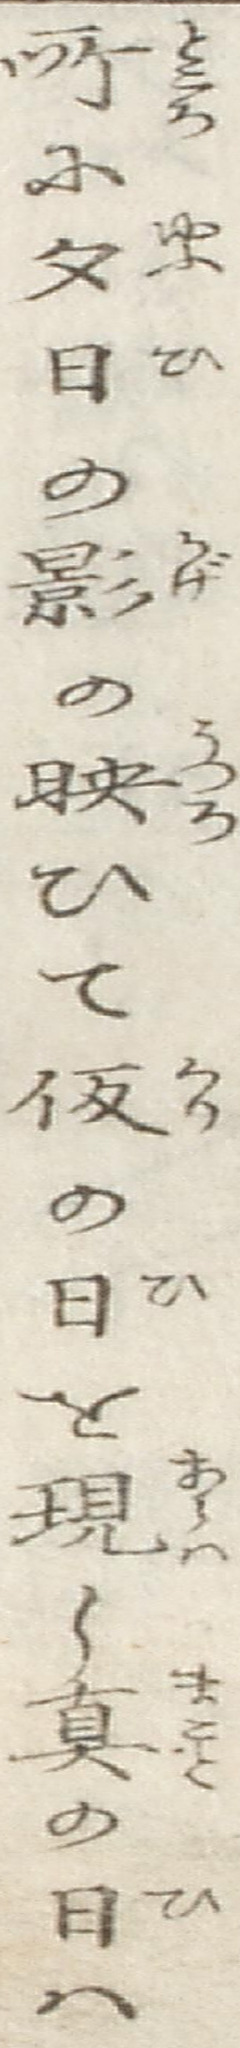所に夕日の影の映ひて仮の日を現し真の日は
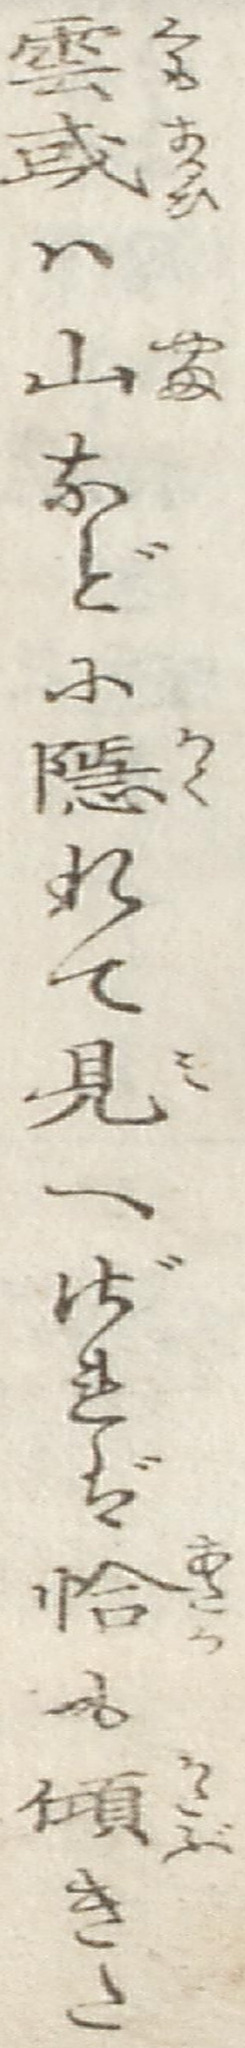雲或は山などに隠れて見へざれば恰も傾きた
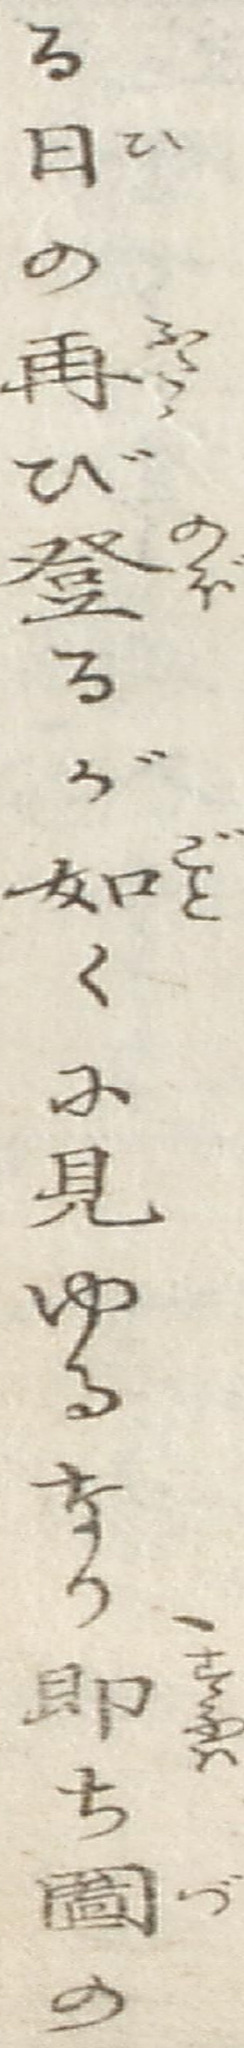る日の再び登るが如くに見ゆるなり、即ち図の
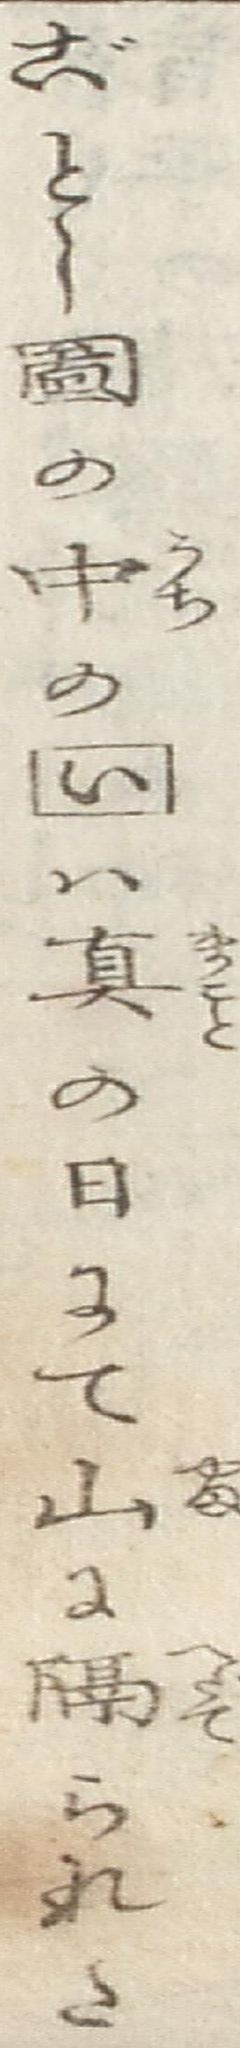ごとし図の中のいは真の日にて山に隔られた
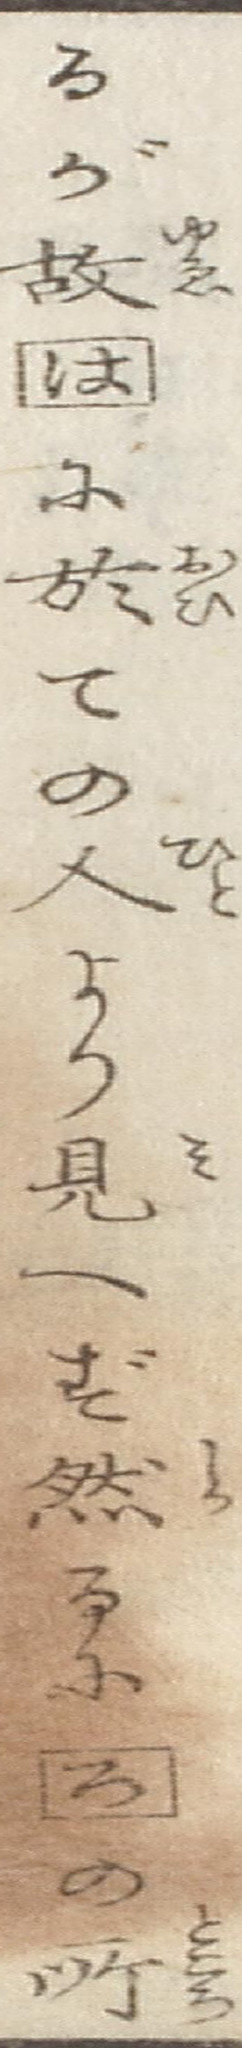るが故はに於ての人より見へず然るにろの所
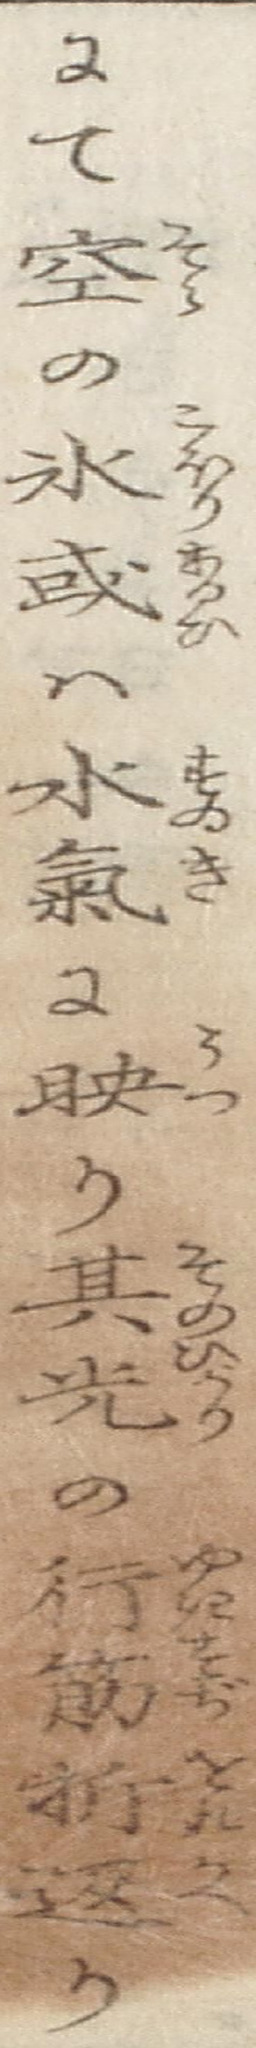にて空の氷或は水気に映り其光の行筋折返り
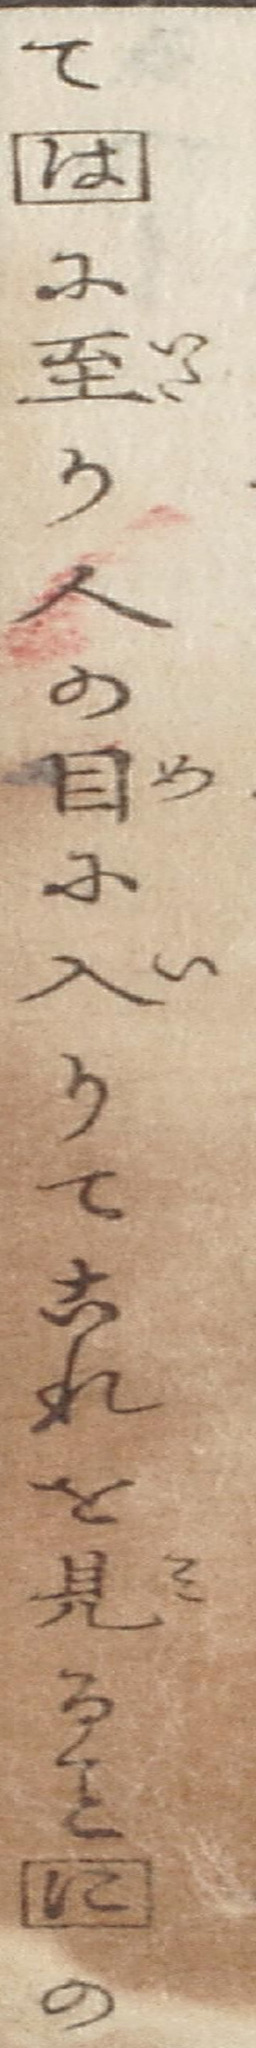てはに至り人の目に入りてこれを見ることにの
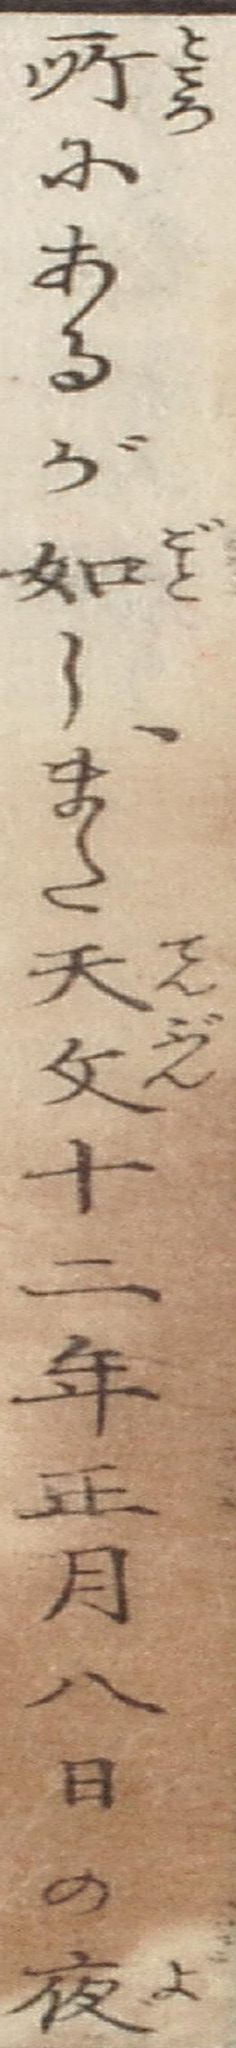所にあるが如し、また天文十二年正月八日の夜
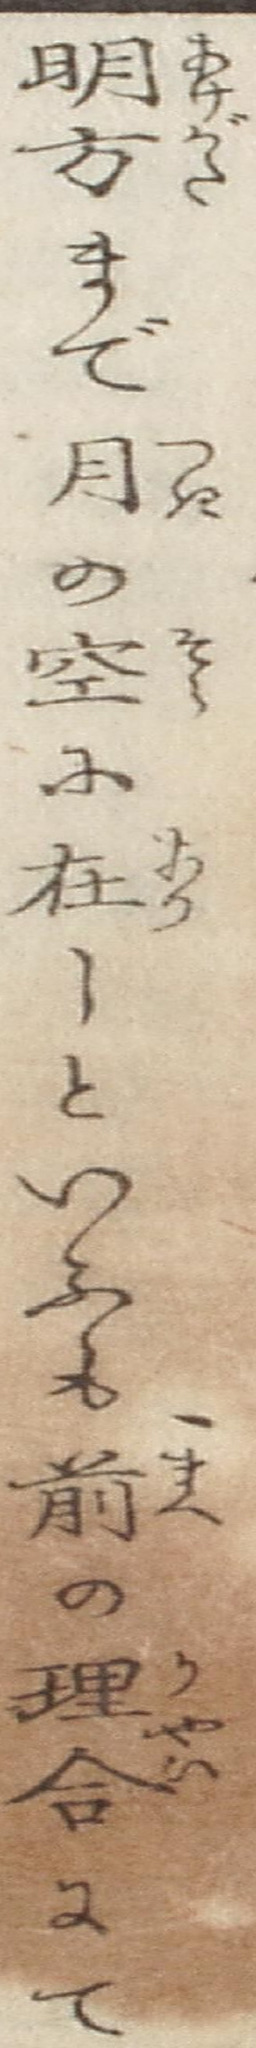明方まで月の空に在しといふも、前の理会にて
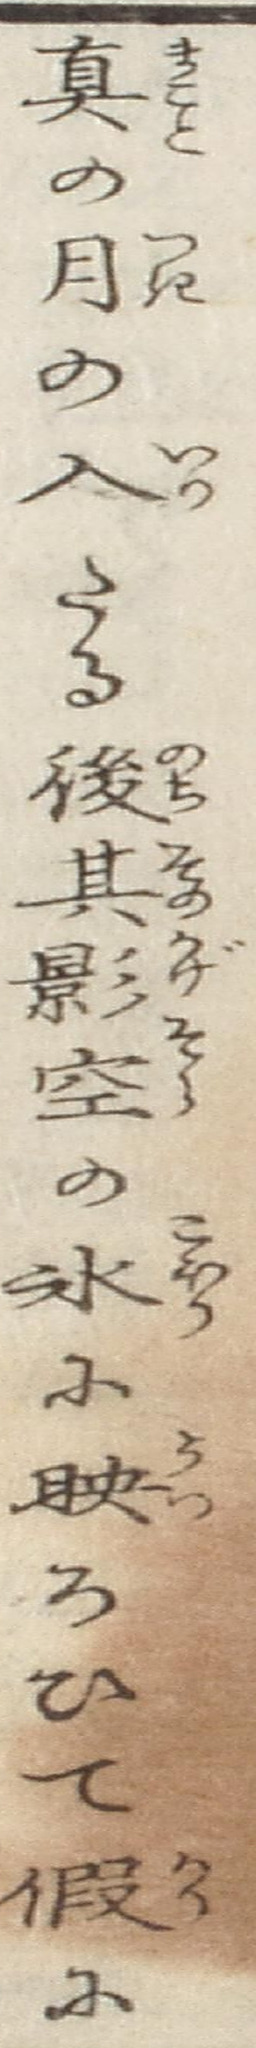真の月の入たる後其影空の氷に映ろひて仮に
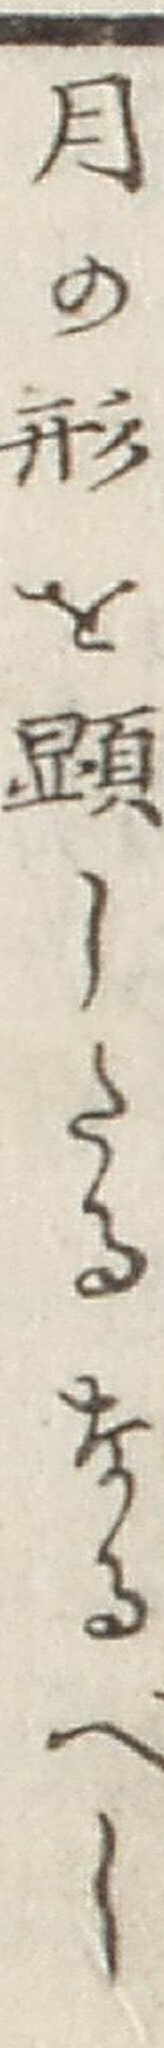月の形を顕したるなるべし
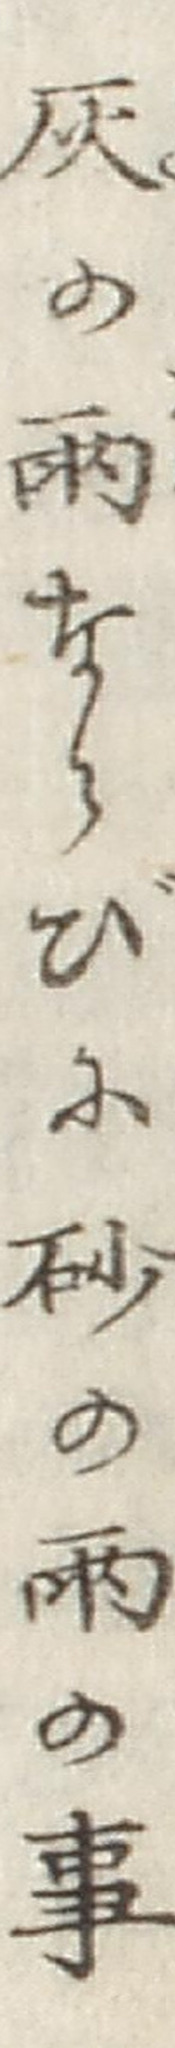灰の雨ならびに砂の雨の事
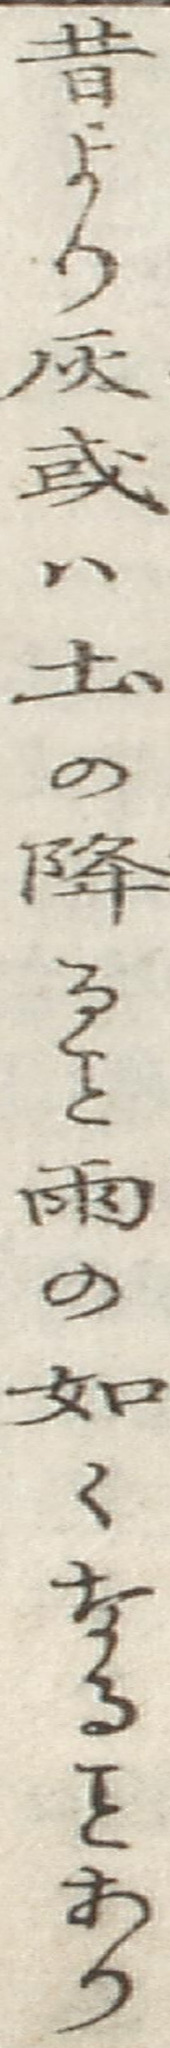昔より灰或は土の降ること雨の如くなることあり
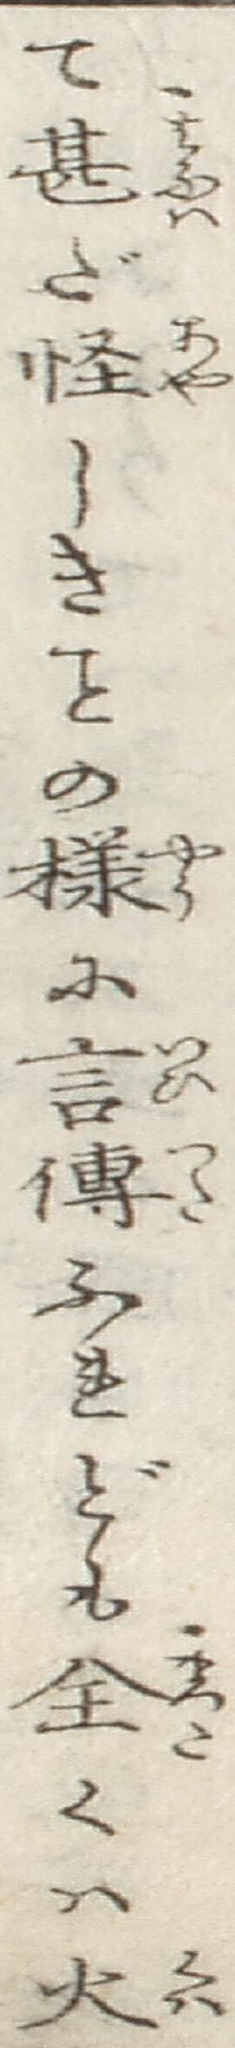て、甚だ怪しきことの様に言伝ふれども全くは火
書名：変異辯　一名、天變地異拾遺　全
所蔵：東京大学地震研究所図書室 Earthquake Research Institute Library, The University of Tokyo, JAPAN
